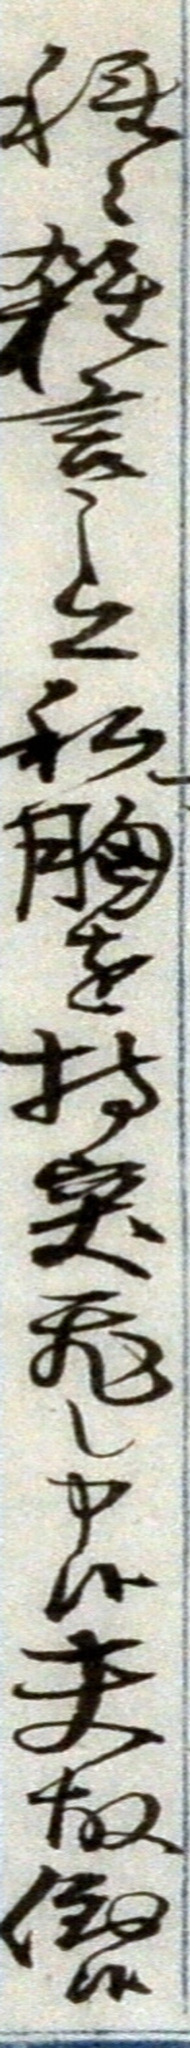種々雑言之上私胸を持突飛し申候夫故倒候
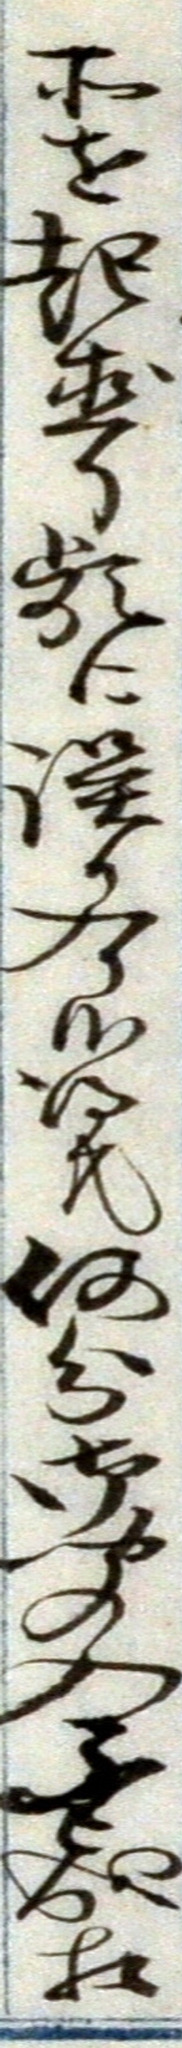所を起直り頻に誤り入り候得共何分御聞入不被成相
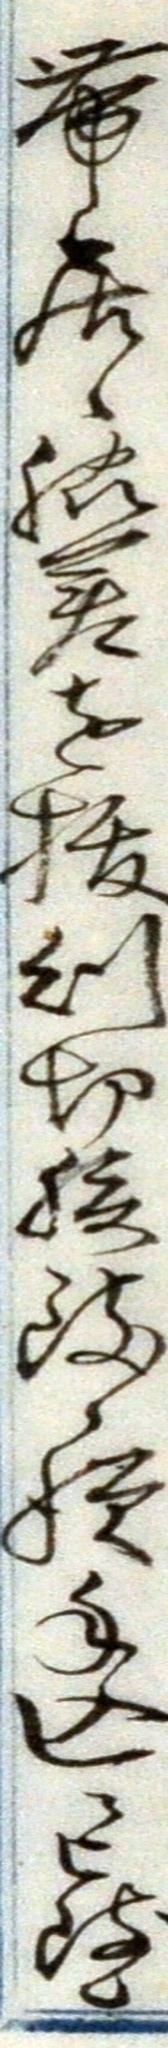帯居候脇差を抜則切腹致候様手込ニ被致候
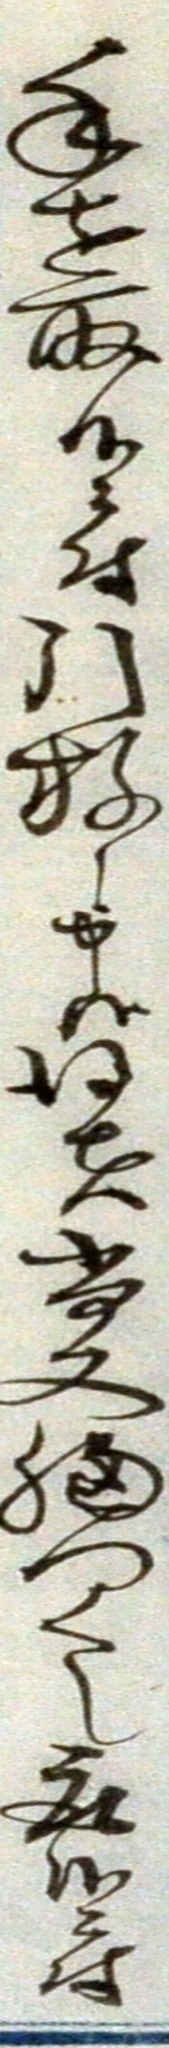手を取候ニ付引放し申候得者尚又胸つくし取候ニ付
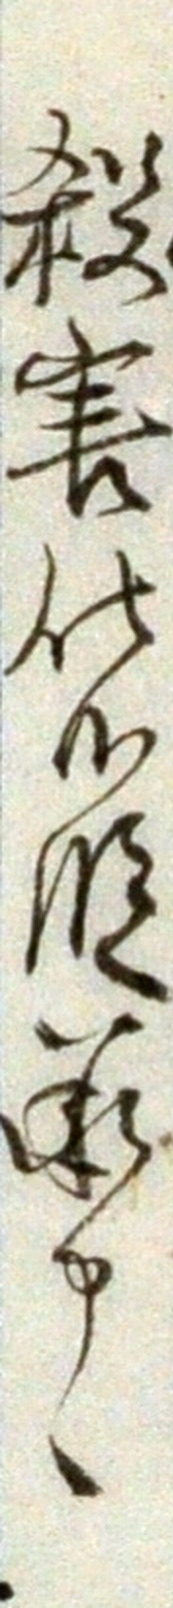殺害仕候段承申候
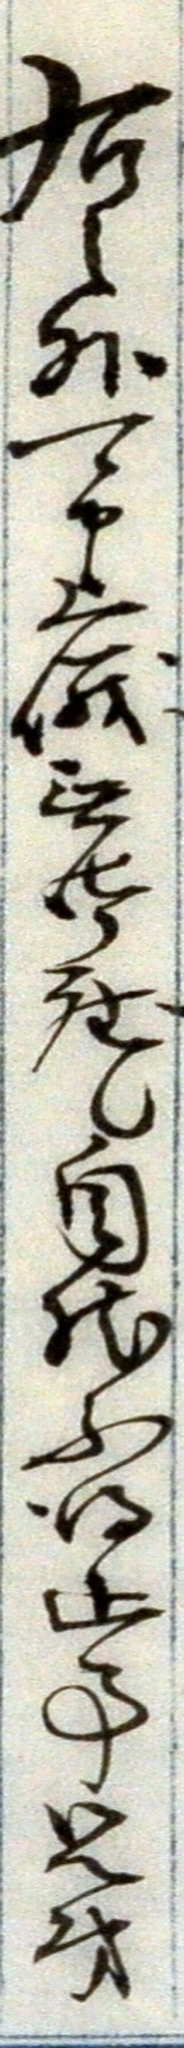右之外可申上儀無御座候自然不得止事兄弟
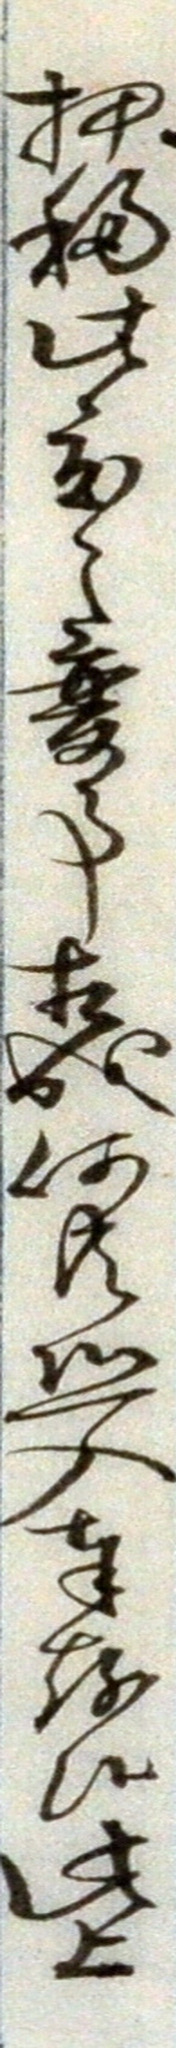押移此度之変事相成何共恐入奉存候此上
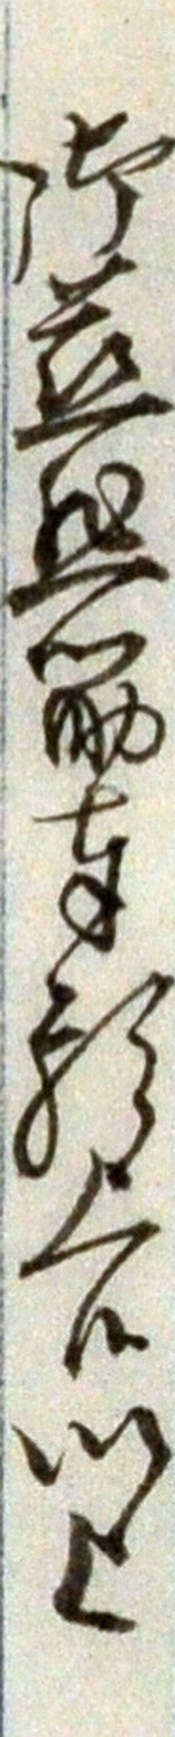御慈悲筋奉願上候以上
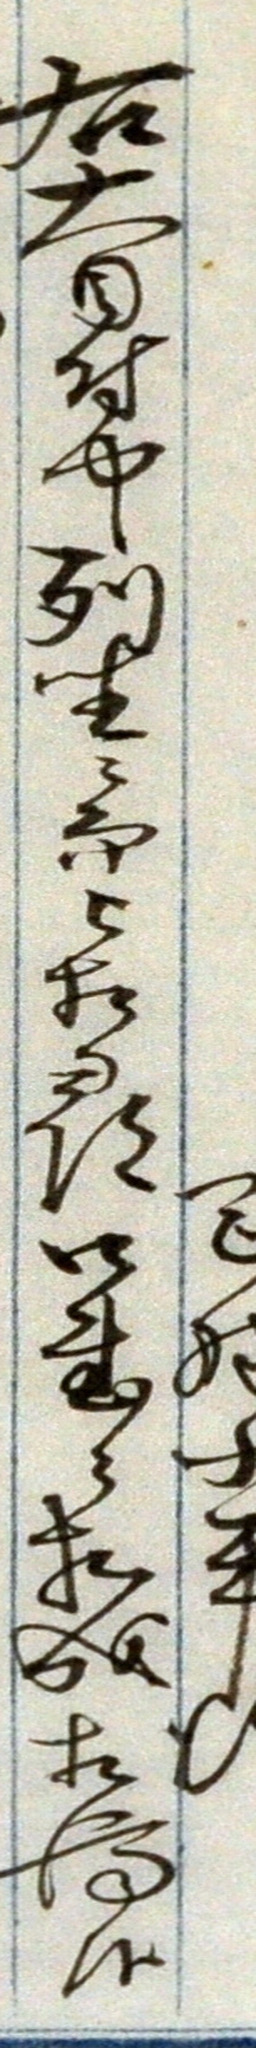右大目付中列座ニ而被相尋口書ニ相成相済候
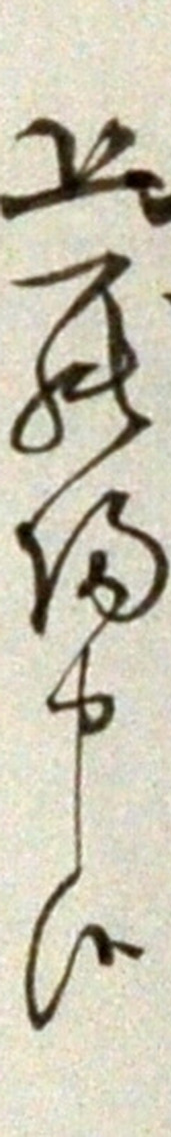上罷帰申候
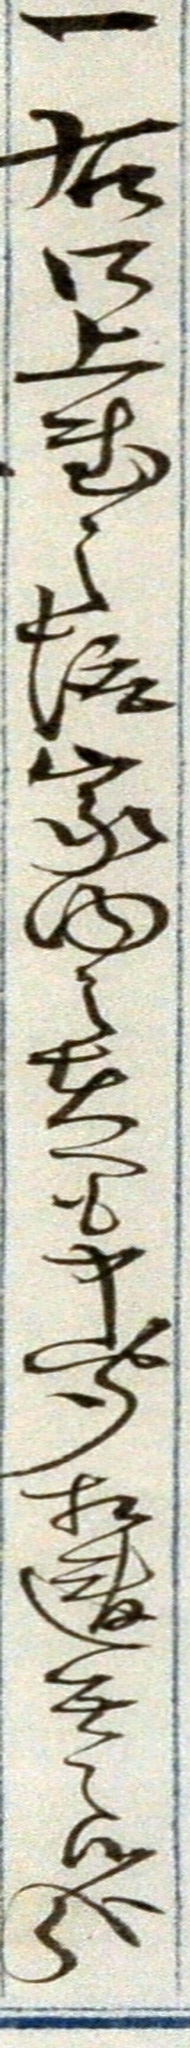一右口上書之趣家内之者へも申聞相違無之候哉
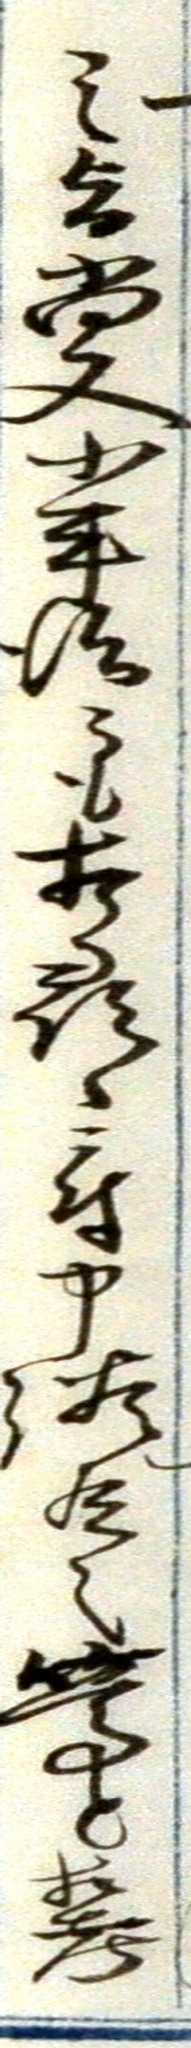之旨尚又小平治ニも相尋候ニ付申談有之篤と相考

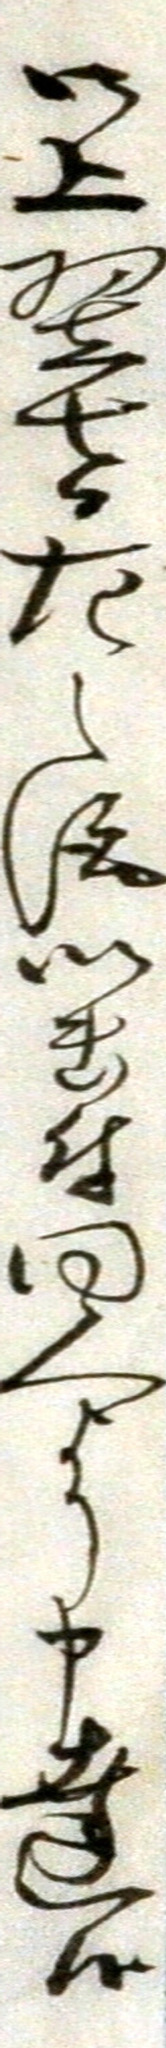口上翌七日左之趣以書付同人より申達候
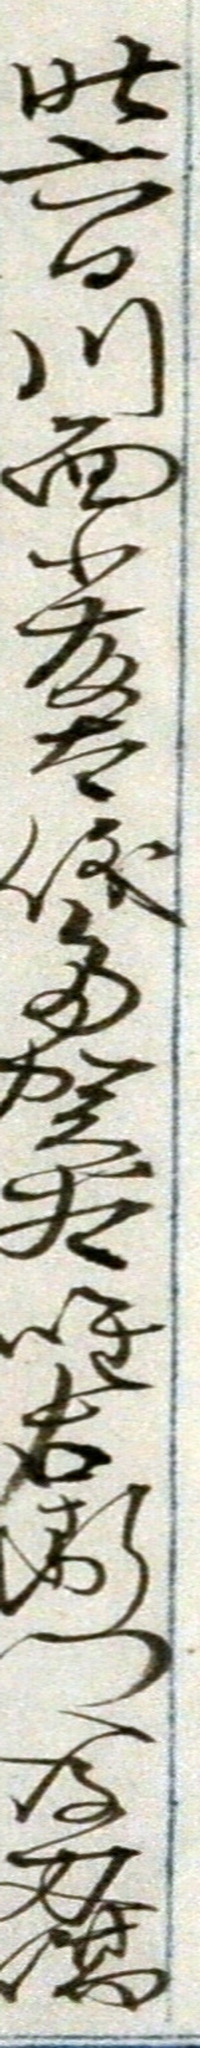昨六日川面小藤太儀多賀谷唯右衛門へ及刃傷
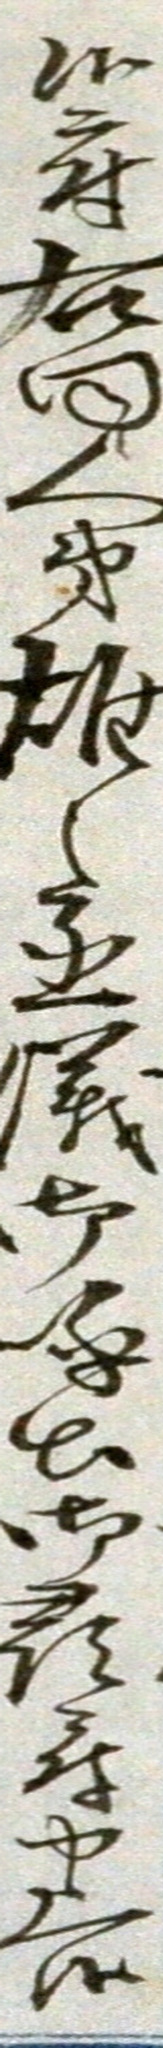候ニ付右同人弟雄之丞儀御呼出御尋ニ付申上候
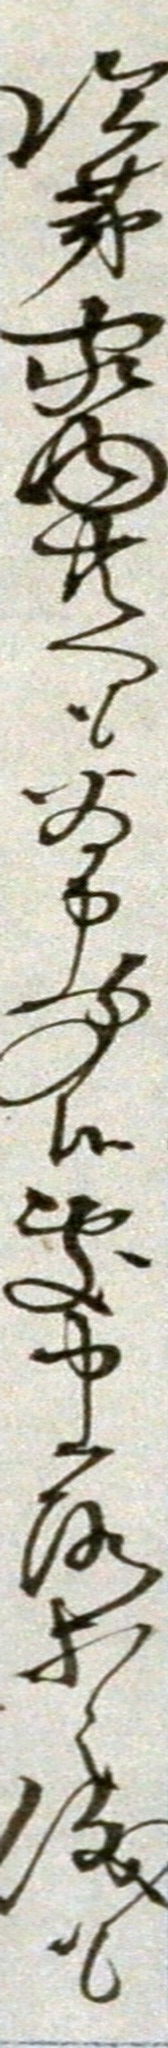次第家内共へも為申聞候處申落抔之儀も
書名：川面小藤太子細有之多賀谷唯右衛門ヲ打果候一件
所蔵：伊那市立高遠町図書館・合同会社AMANE
